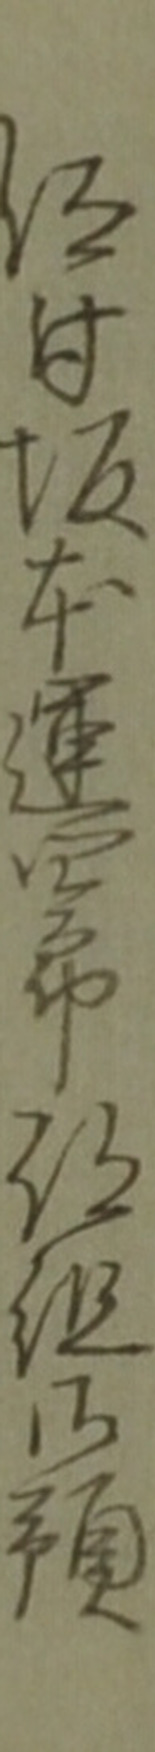仰付坂本運四郎跡組御預
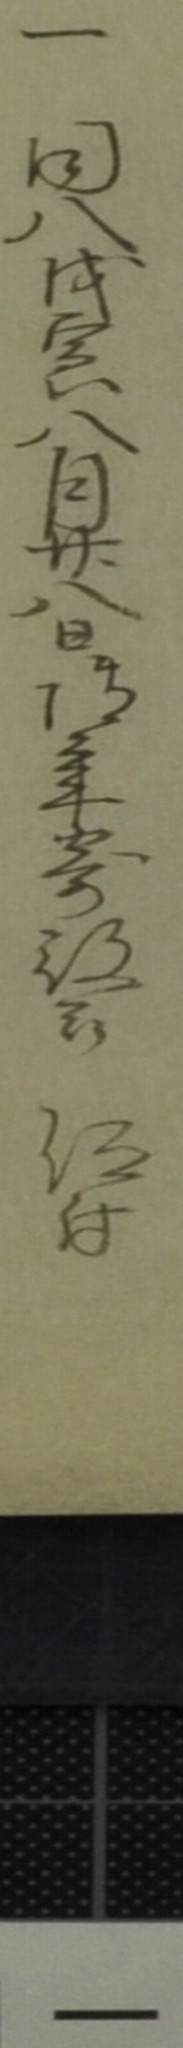一同八戊寅八月廿八日御年寄役被仰付
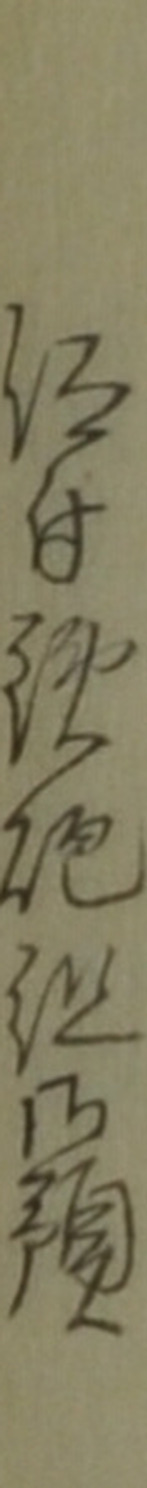仰付鉄砲組御預
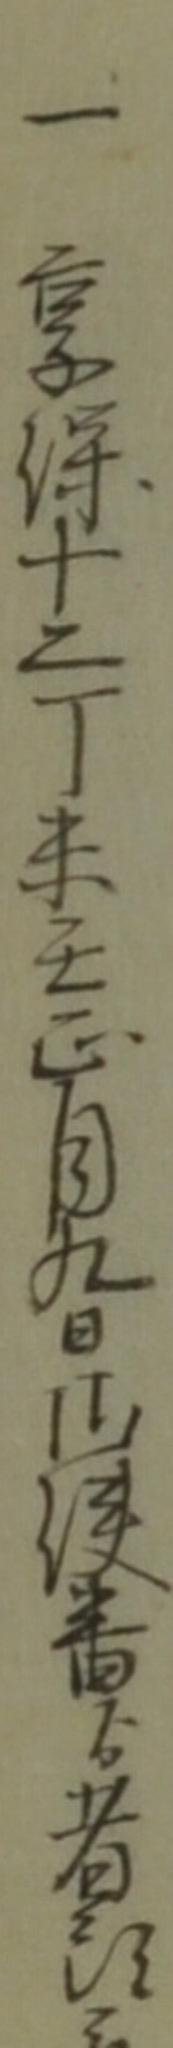一享保十二丁未閏正月九日御使番ゟ者頭被
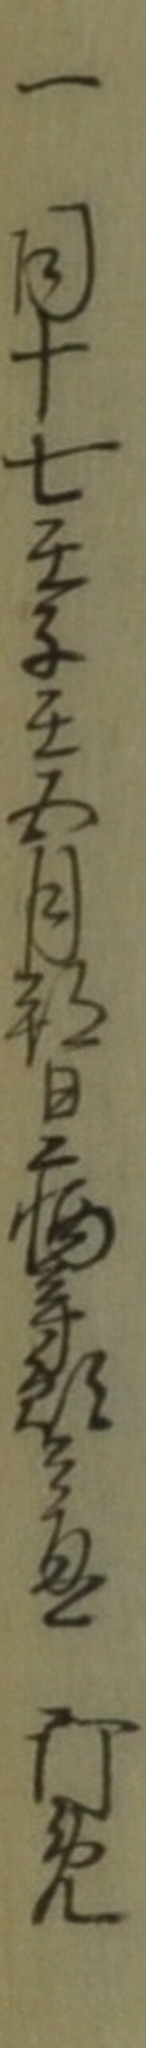一同十七壬子閏五月朔日病気願之通御免
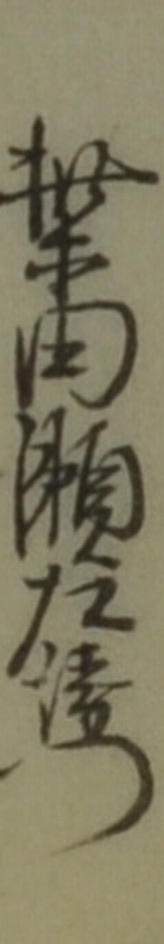柴田瀬左衛門
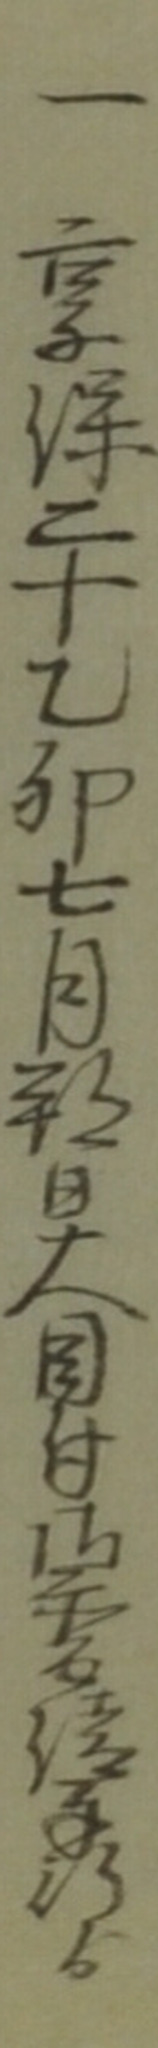一享保二十乙卯七月朔日大目付御普請奉行ゟ
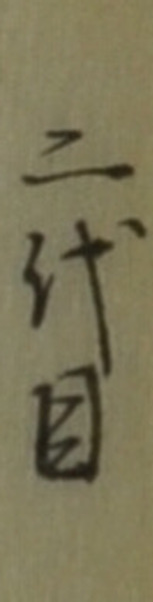二代目
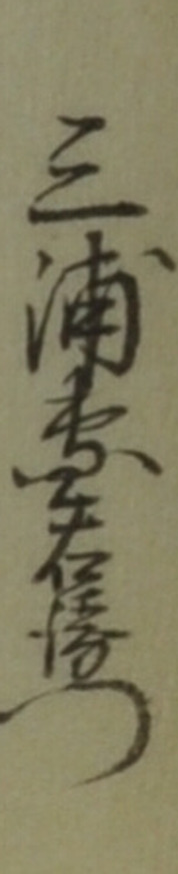三浦団右衛門
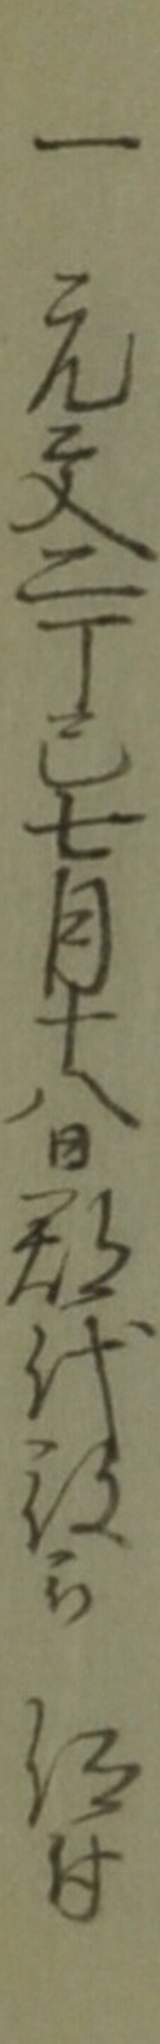一元文二丁巳七月十八日郡代役被仰付
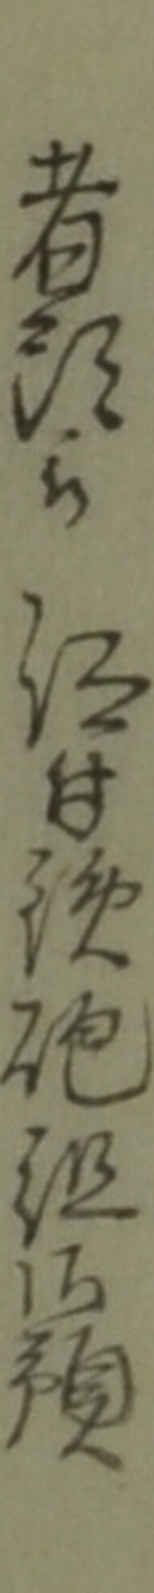者頭被仰付鉄砲組御預
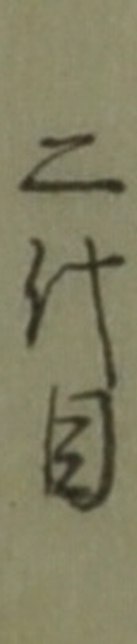二代目
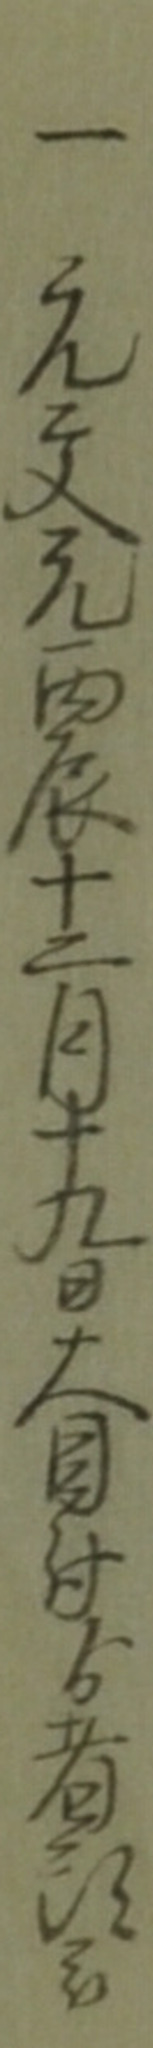一元文元丙辰十二月十九日大目付ゟ者頭被
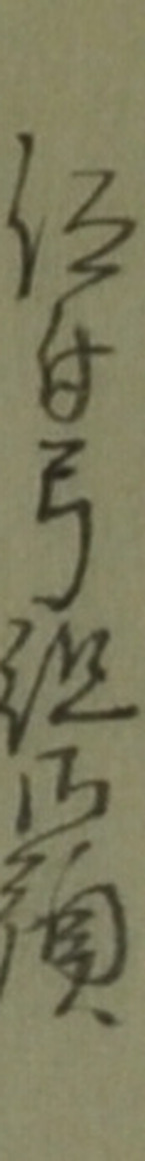仰付弓組御預
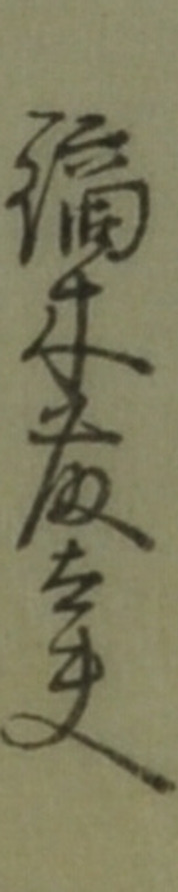鏑木藤太夫
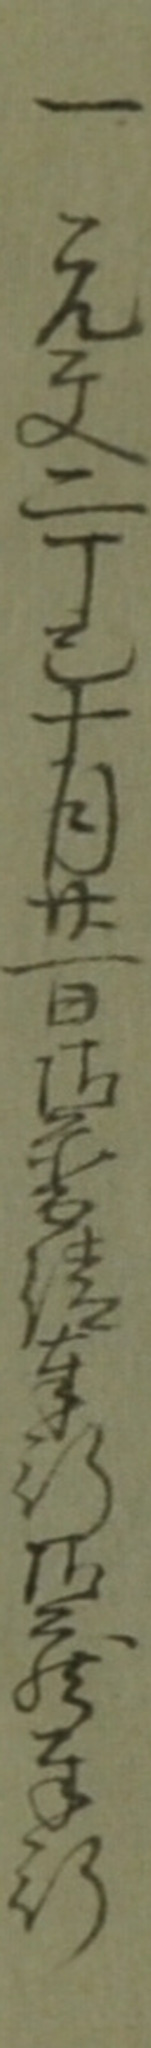一元文二丁巳年十月廿一日御普請奉行御蔵奉行
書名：諸御役代々録（二）
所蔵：伊那市立高遠町図書館・合同会社AMANE
